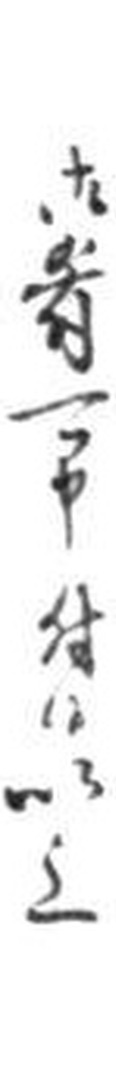御肴可申付候以上
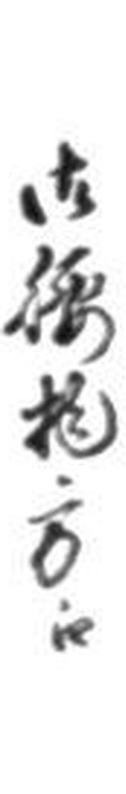御腰物方江
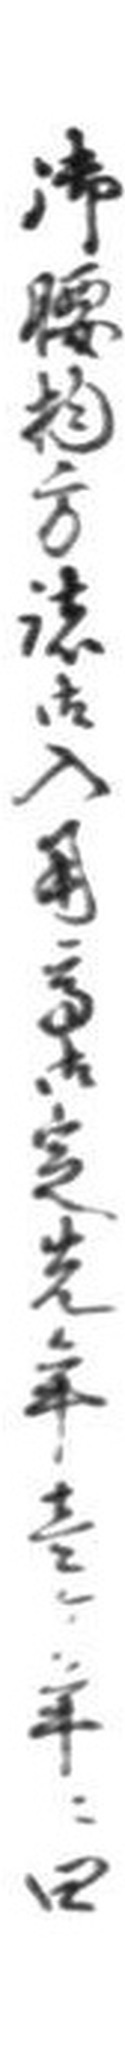御腰物方諸御入用高御定先年壱ケ年ニ四
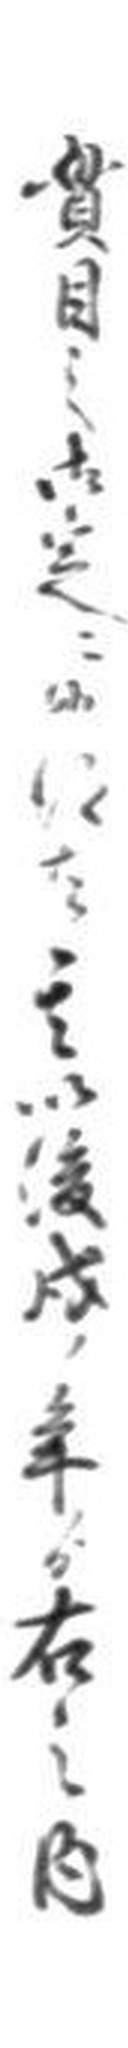貫目之御定ニ候得共其以後戌ノ年ゟ右之内
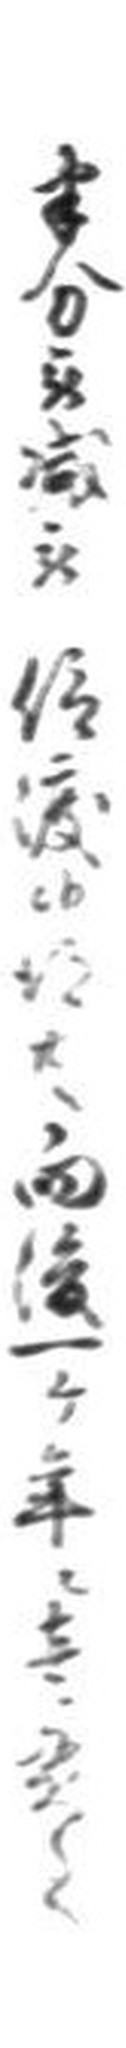半分被減被仰渡候得共向後一ケ年ニ壱貫匁
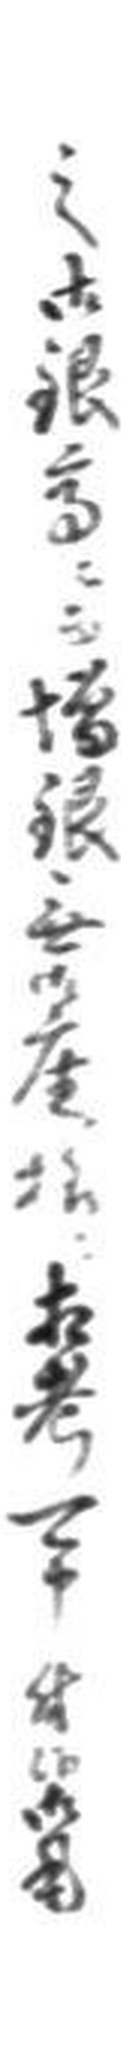之御銀高ニ而増銀無御座様ニ相考可申付候御用
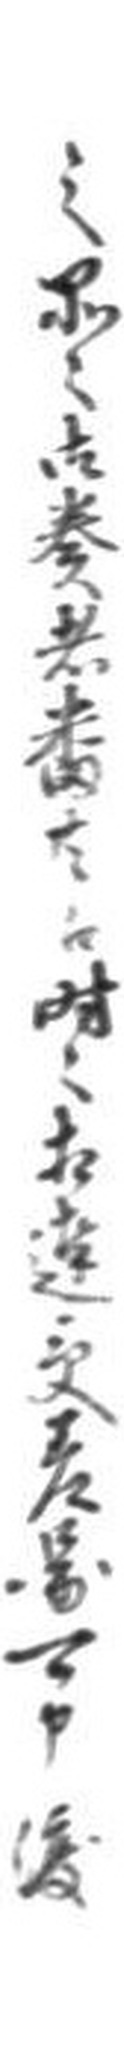之品々御奏者番共江時々相達受差図可申渡
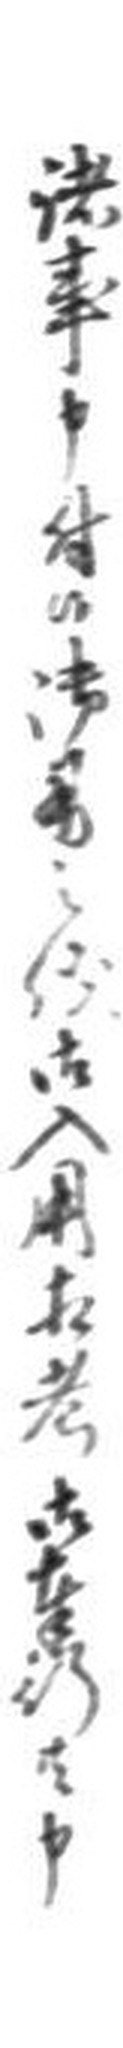諸事申付候御用之儀御入用相考御奉行共申
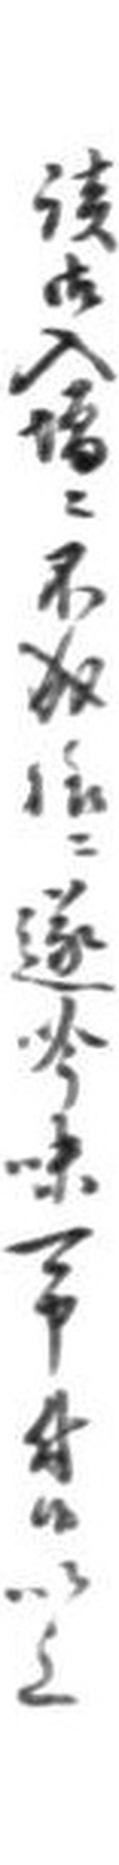談御入増ニ不成様ニ遂吟味可申付候以上

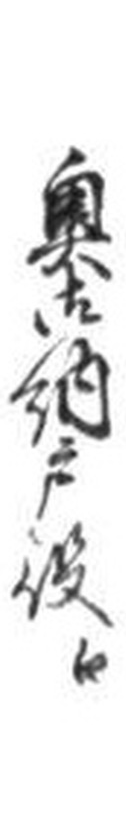奥御納戸役江
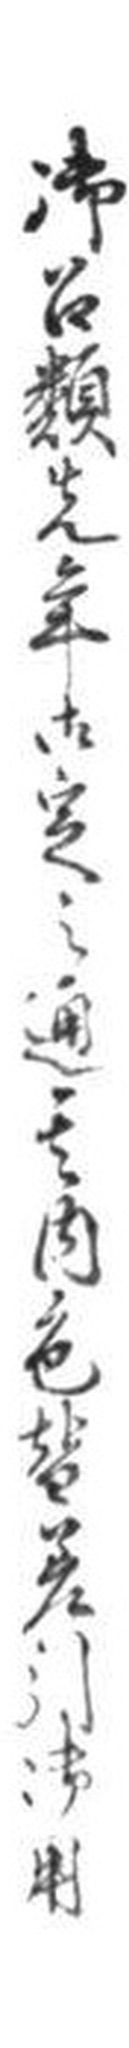御召類先年御定之通其内色替差引御用
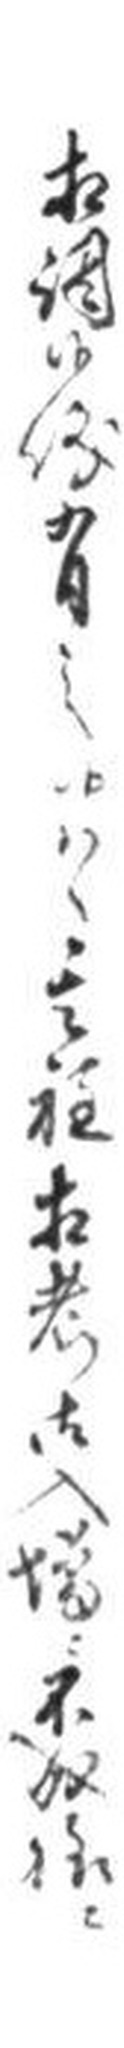相調候儀有之候ハヽ其程相考御入増ニ不成様ニ
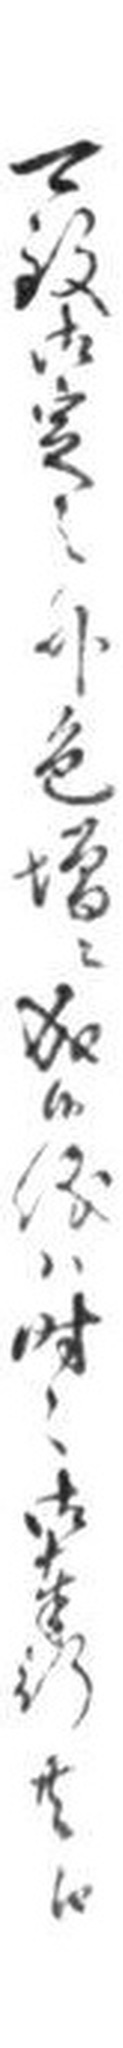可致御定之外色増ニ成候儀ハ時々御奉行共江
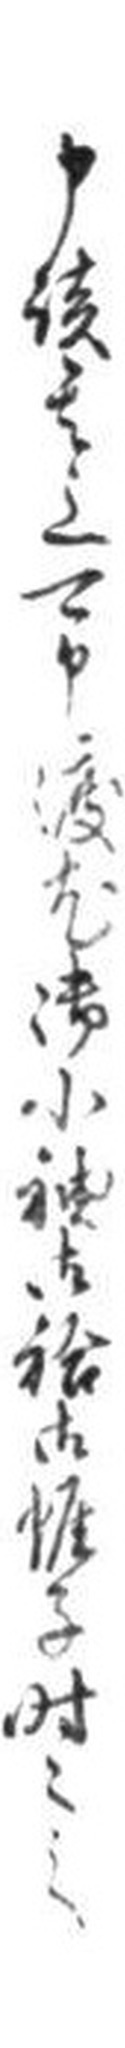申談其上可申渡尤御小袖御袷御帷子時々之
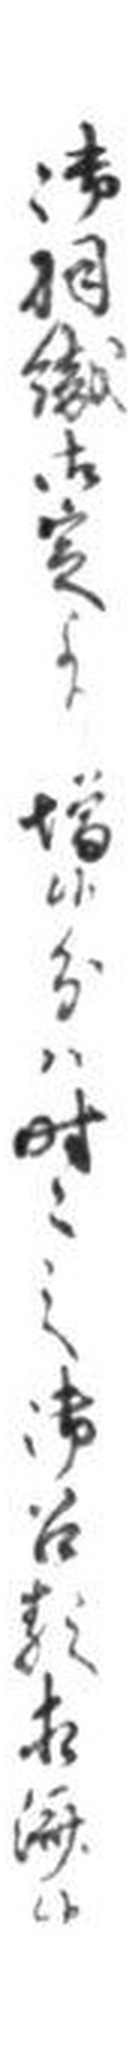御羽織御定より増候分ハ時々之御召類相済候
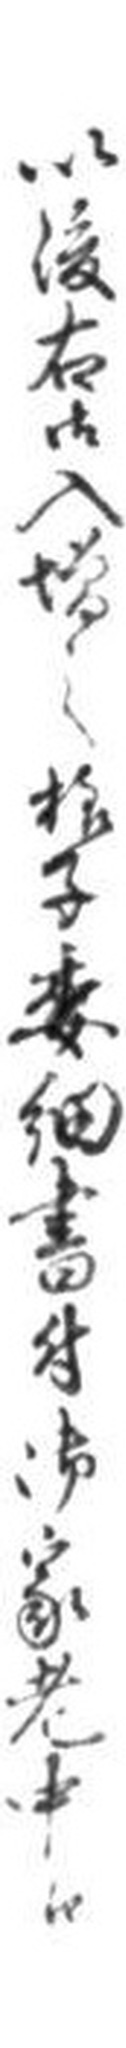以後右御入増之様子委細書付御家老中江
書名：家譜 二十二 吉品公 従元禄十五年到同十六年
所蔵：福井県文書館 Fukui Prefectural Archives
